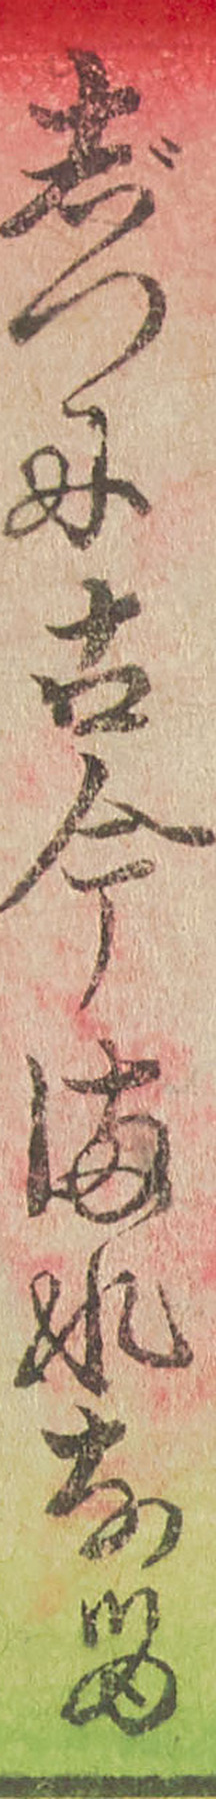じつに古今まれなる
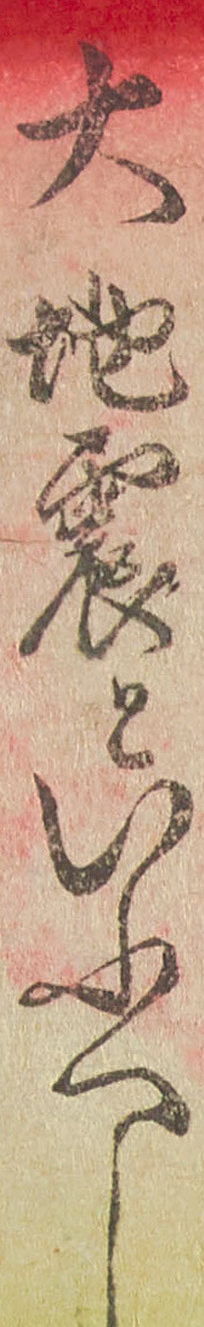大地震といふへし
